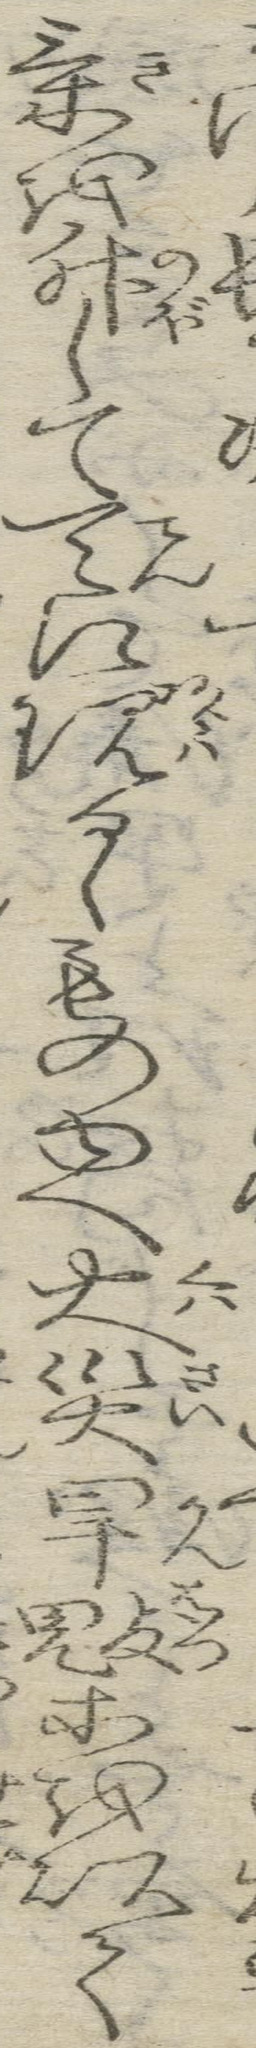気を升して天に現るゝものゆへ火災旱魃等を以て
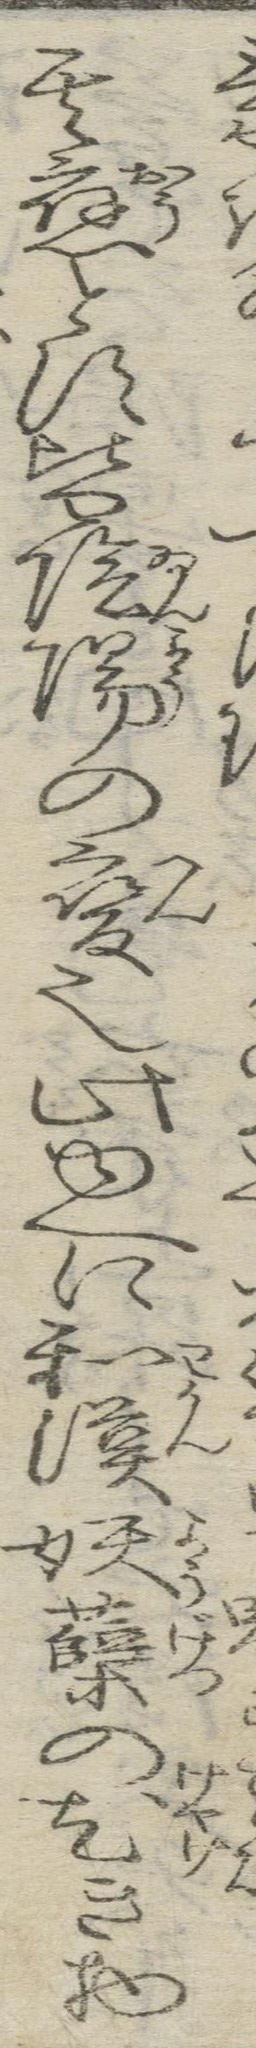其応とす皆陰陽の変也此ゆへに和漢妖蘖の尤き物
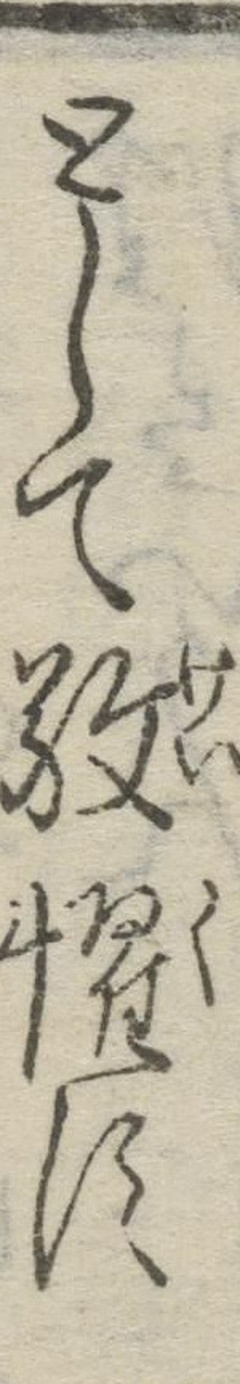として敬懼す
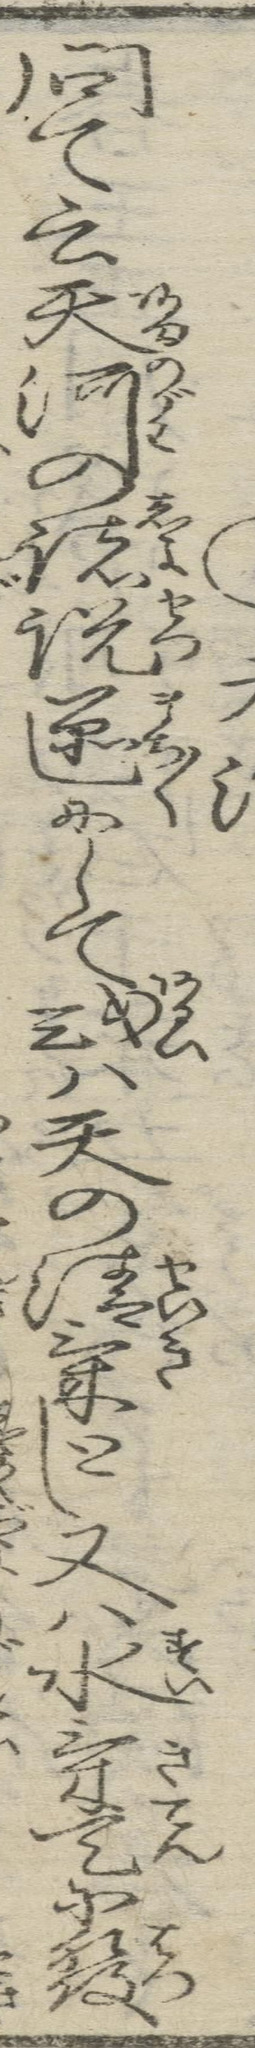問て云天河の諸説區にして或は天の清気とし又は水気天に発
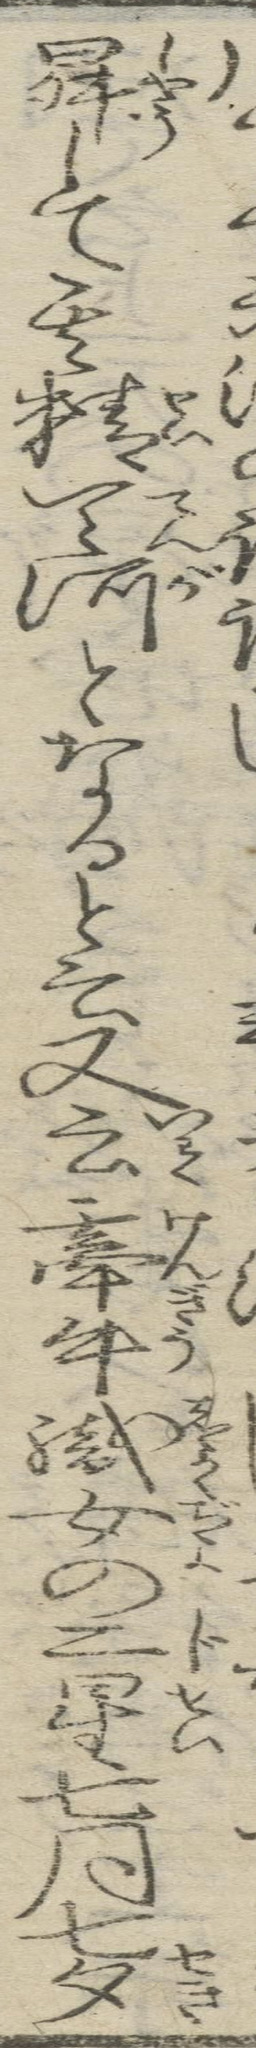昇して其精天河となると云又云牽牛織女の二星七月七夕
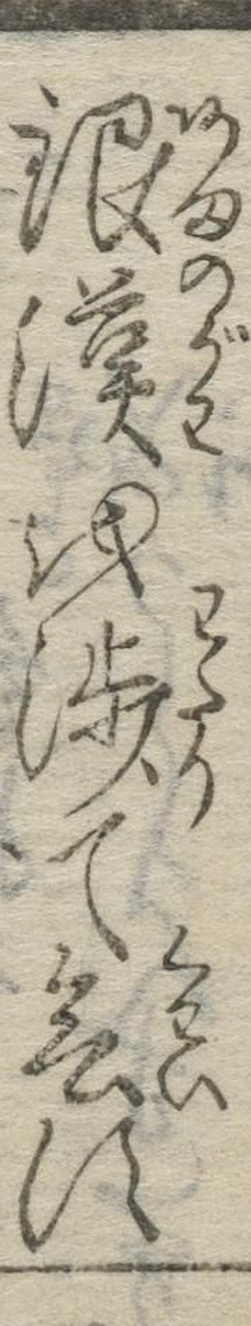銀漢を渉て会す
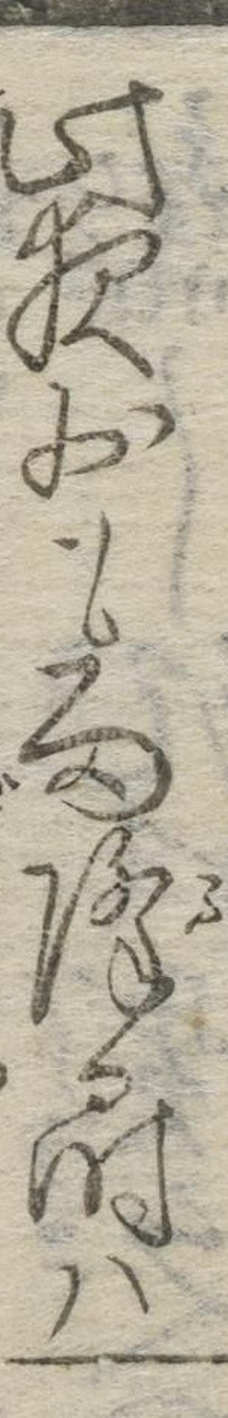此夜少も雨降る時は
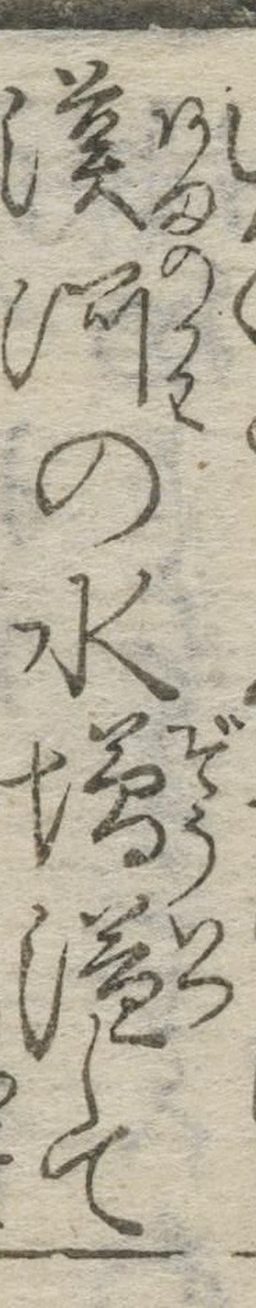漢河の水増溢して
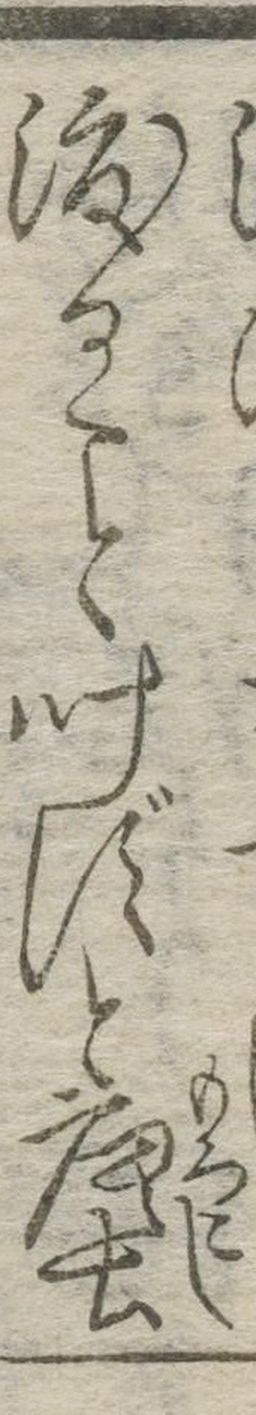渡ること叶ずと唐土
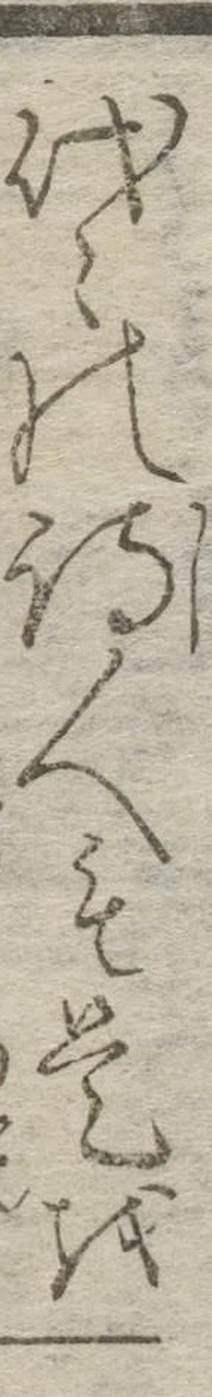代々の詩人も是を
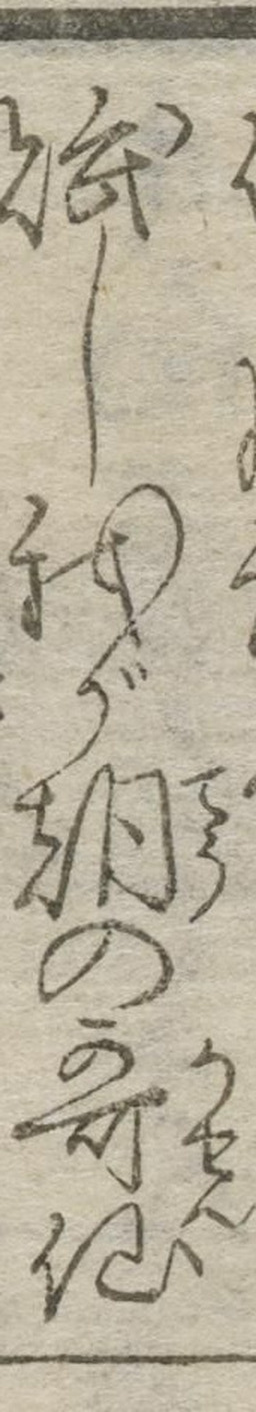賦し我が朝の哥仙
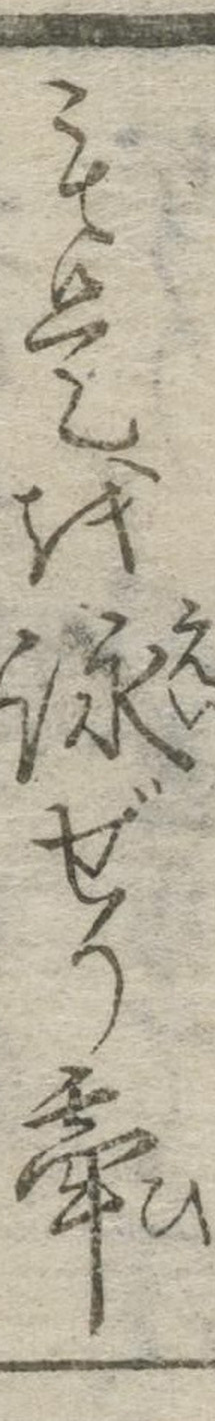も是を詠ぜり牽
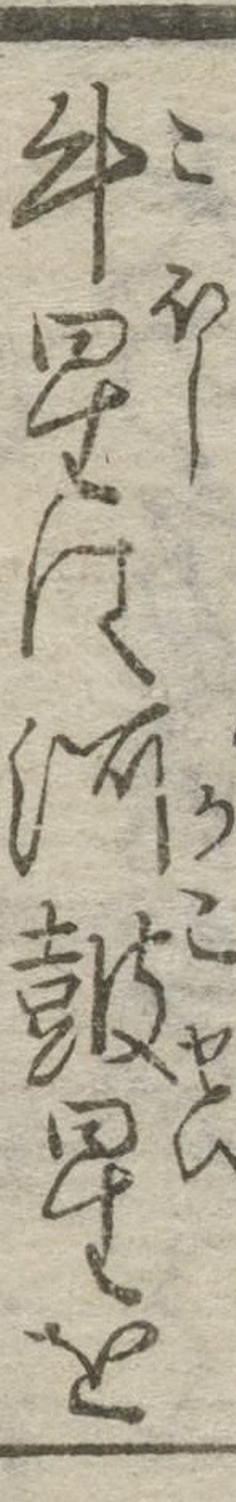牛星は河鼓星を
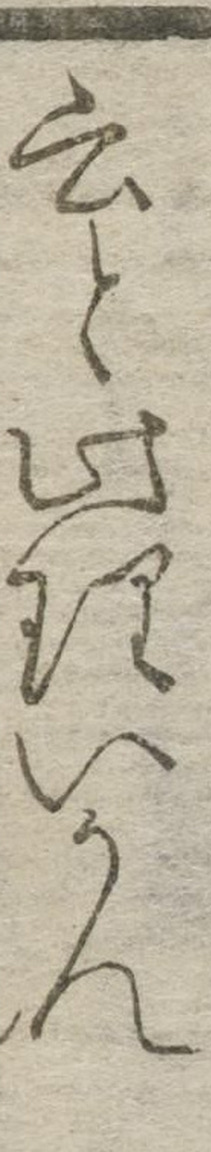云と此理いかん
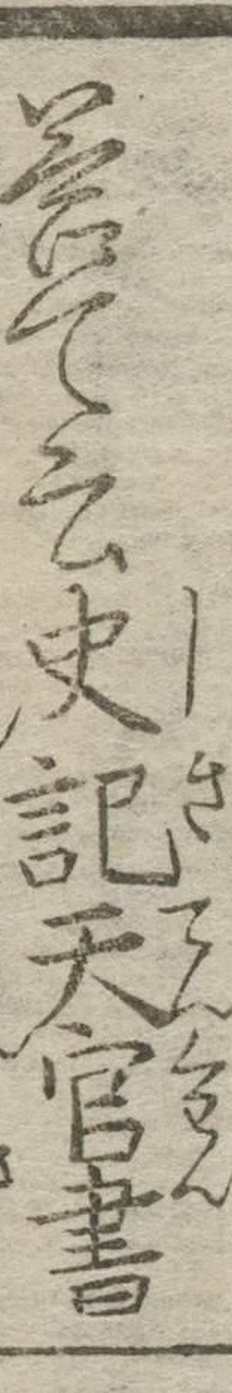答て云史記天官書
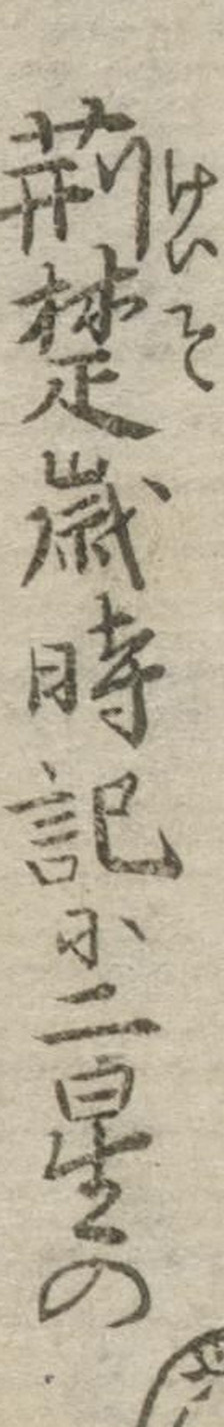荊楚歳時記に二星の
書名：訓蒙天地辨　天
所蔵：東京大学地震研究所図書室 Earthquake Research Institute Library, The University of Tokyo, JAPAN
